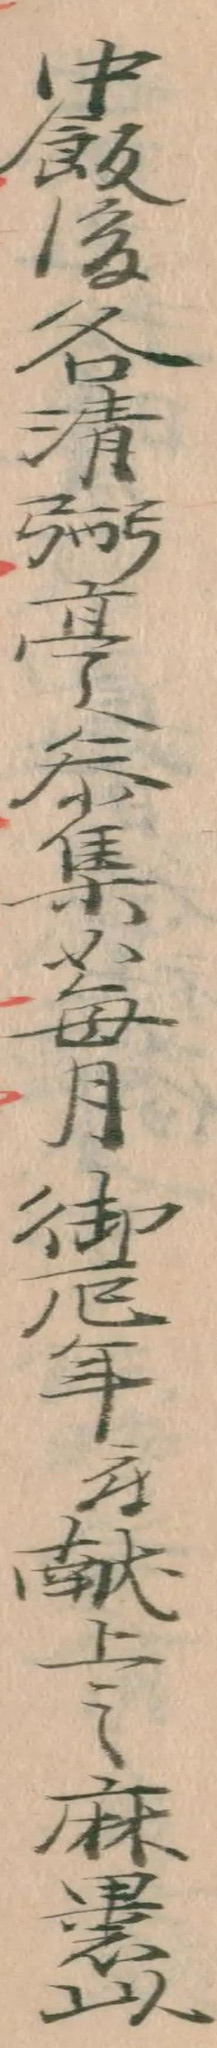一中飯後各清弼亭ヘ参集如毎月御厄年ニ付献上之麻褁以
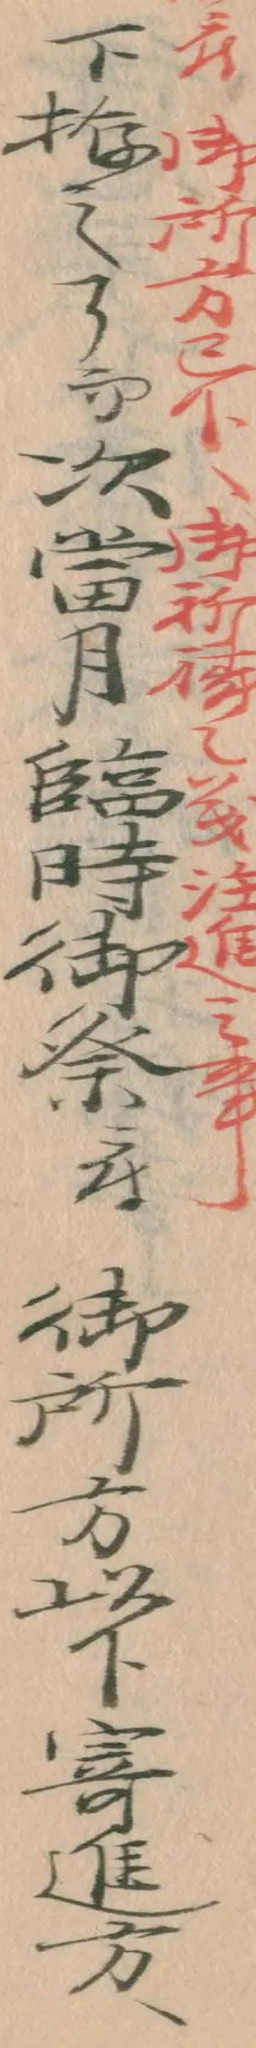下拵之了而次當月臨時御祭ニ付御所方以下寄進方へ
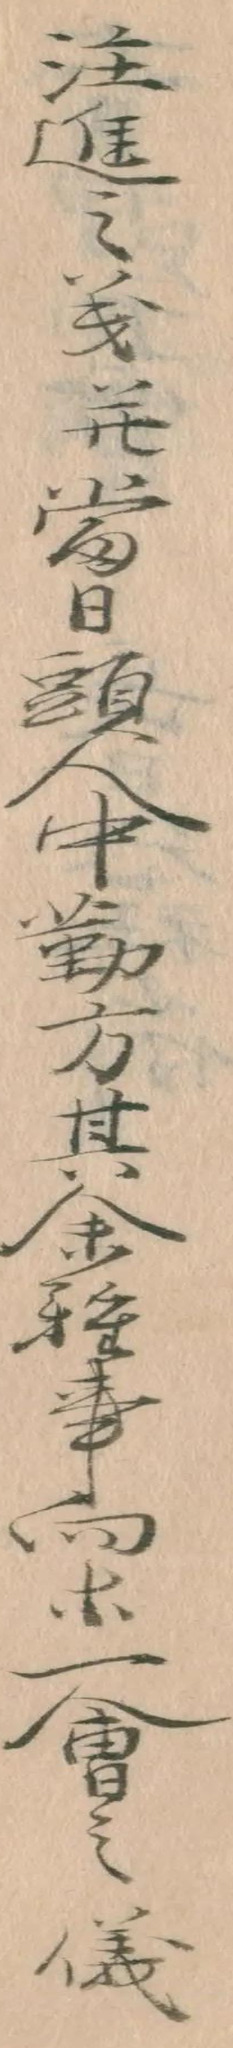注進之義并當日頭人中勤方其余雑事向等一會之儀
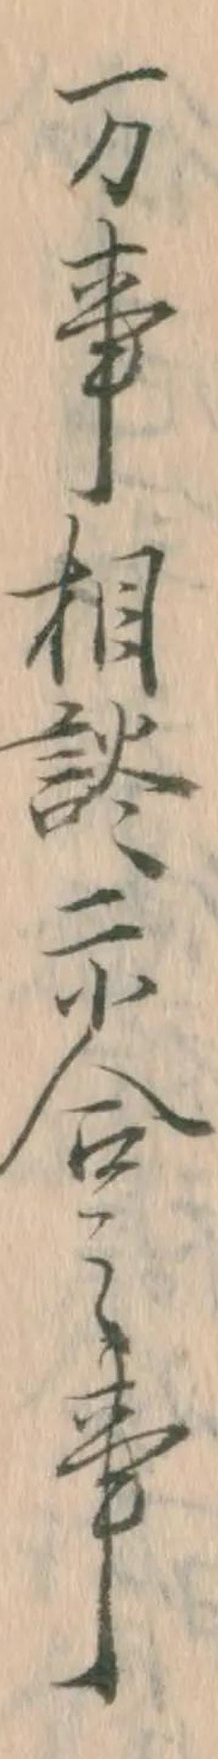万事相談示合之事
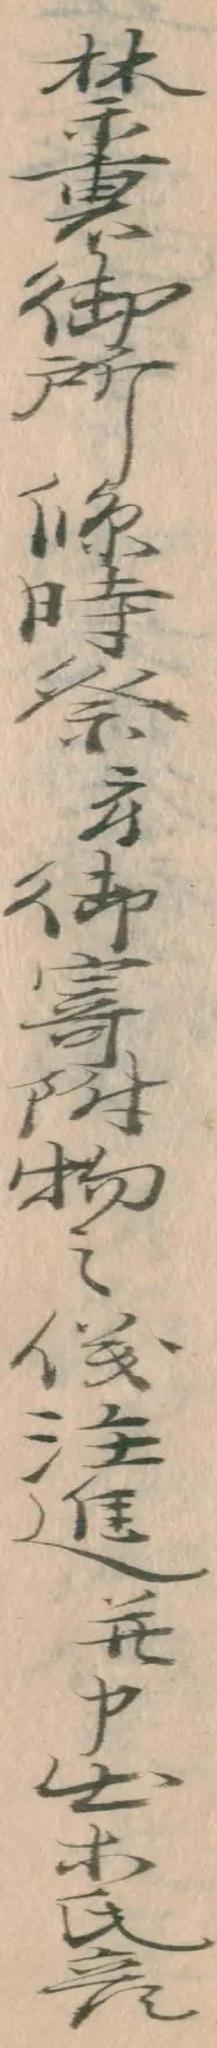禁裏御所臨時祭ニ付御寄附物之儀注進并申出等氏彦
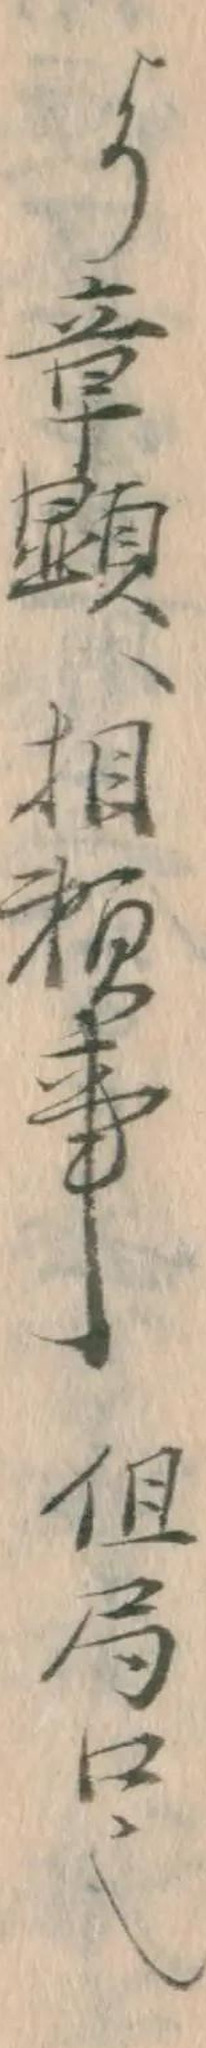より章顕へ相頼事但局口也
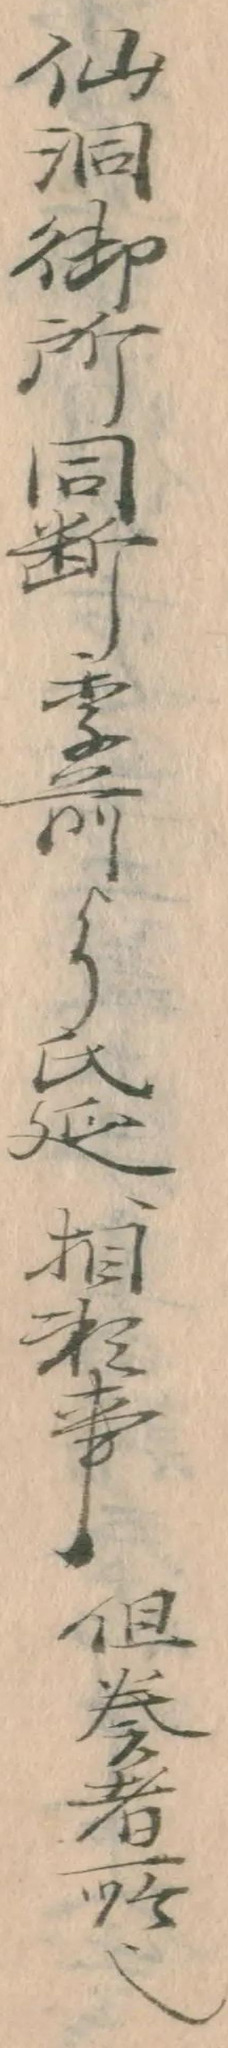仙洞御所同断季前より氏延へ相頼事但奏者所也
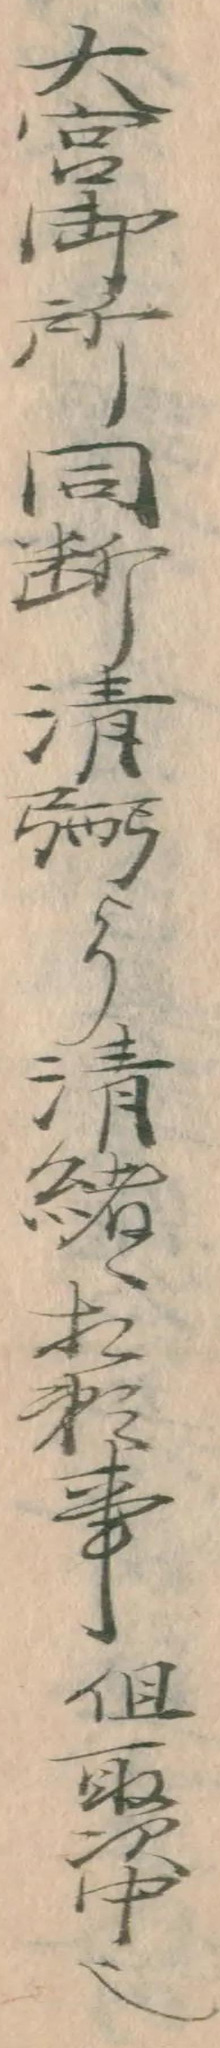大宮御所同断清弼より清緒へ相頼事但取次中也
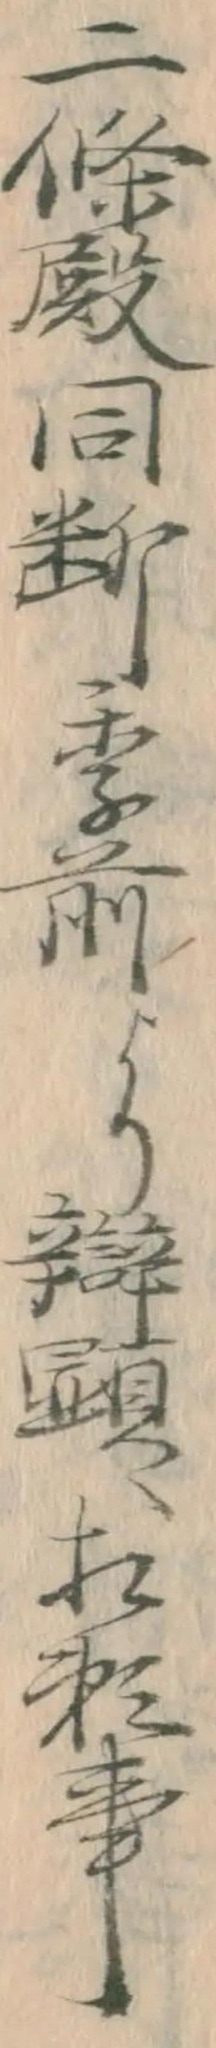二條殿同断季前より辨顕へ相頼事

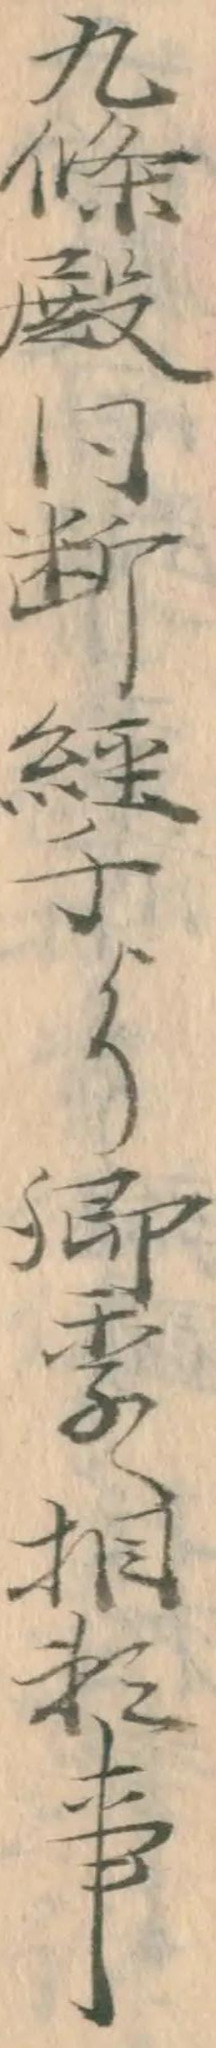九條殿同断経千より卿季へ相頼事
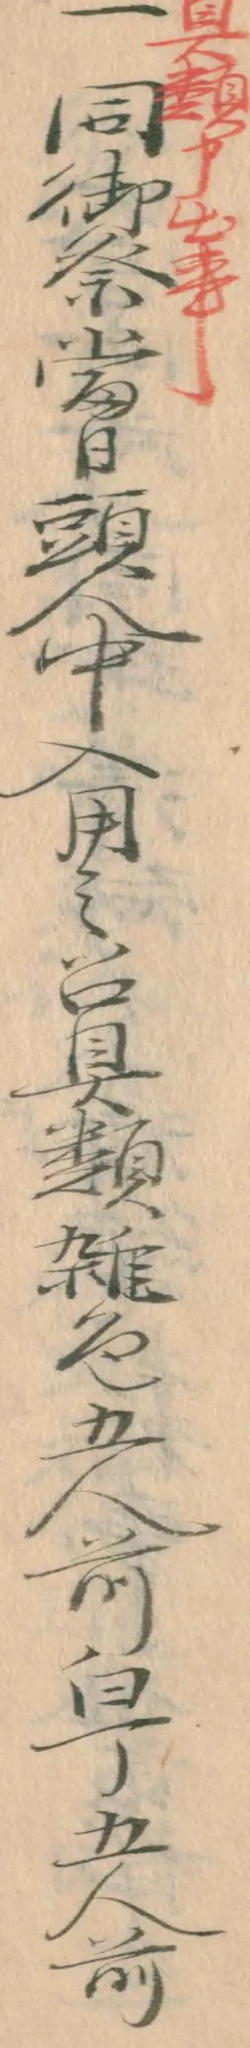一同御祭當日頭人中入用之召具類雑色五人前白丁五人前
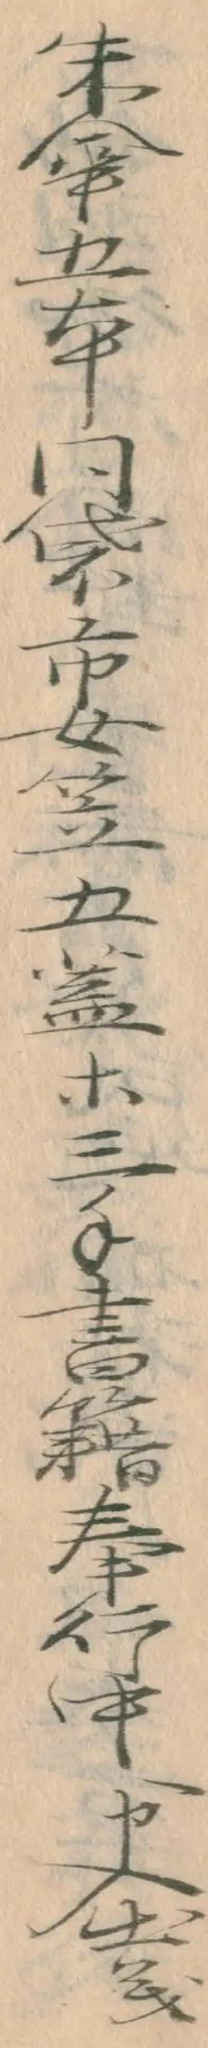朱傘五本同袋市女笠五蓋等三手書籍奉行中へ申入出義
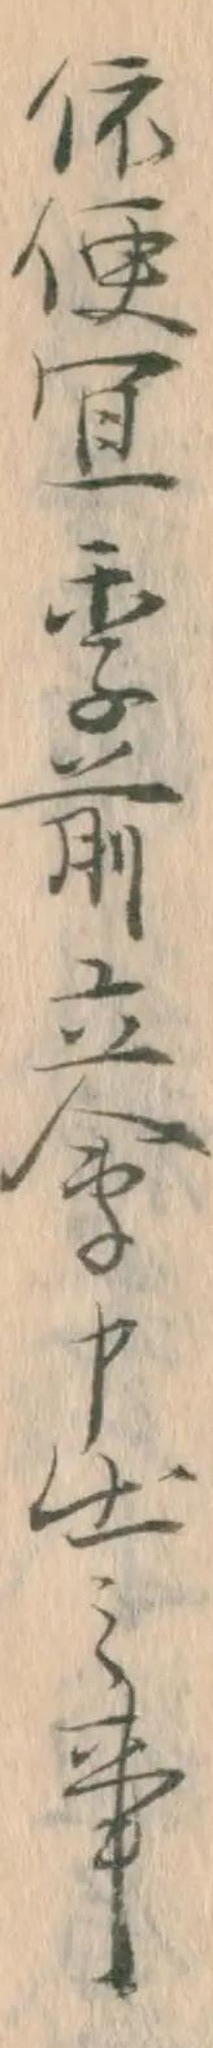依便宜季前立會申出之事
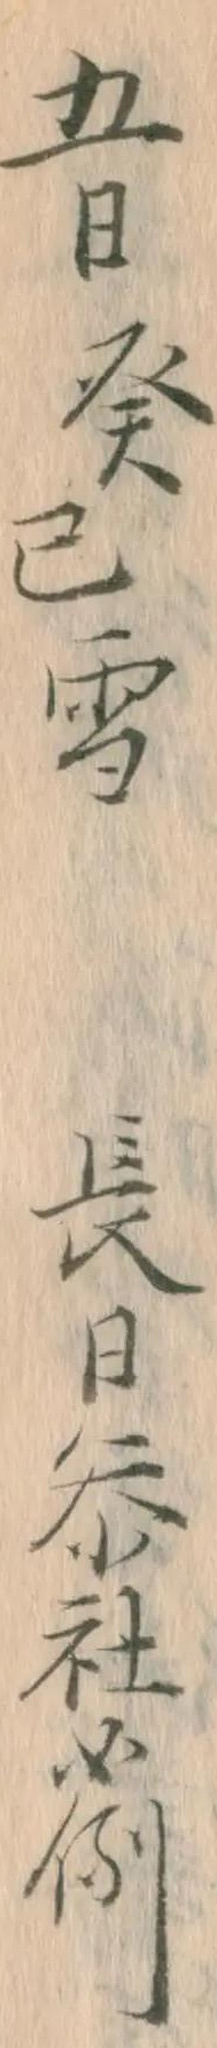五日癸巳雪長日参社如例
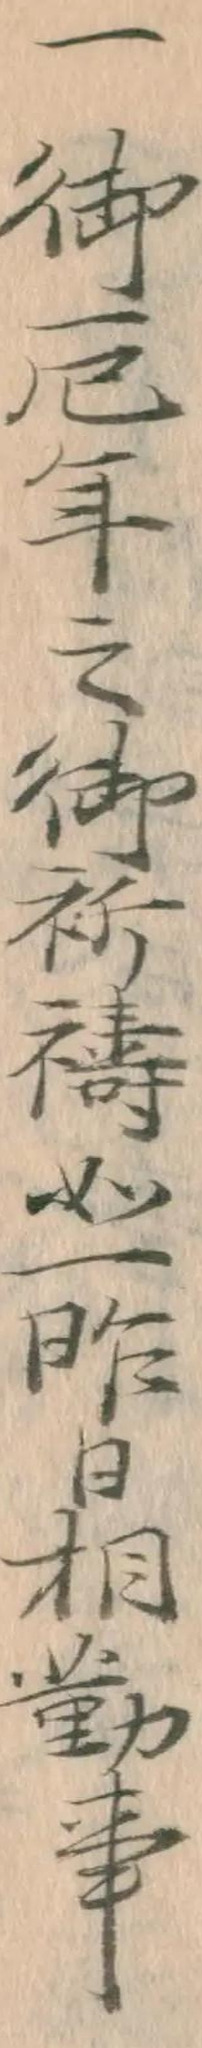一御厄年之御祈祷如一昨日相勤事
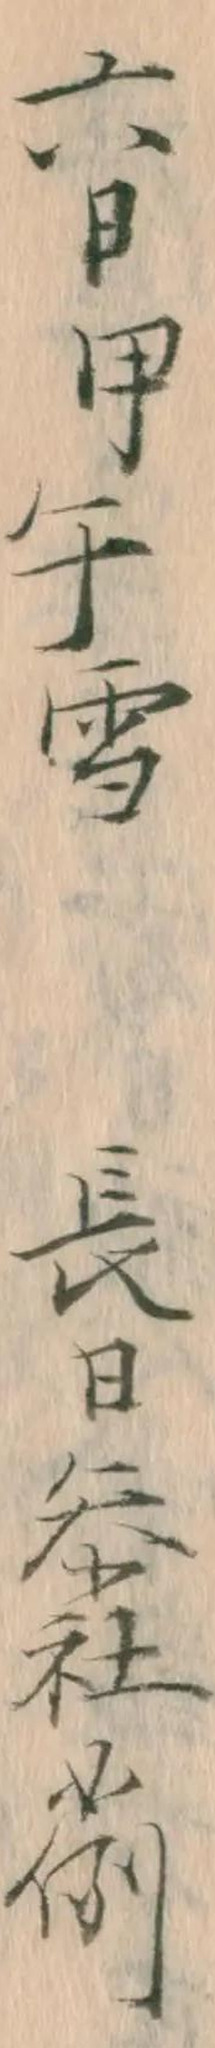六日甲午雪長日参社如例
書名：賀茂社記録. 第74冊
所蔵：国立国会図書館 National Diet Library, JAPAN
